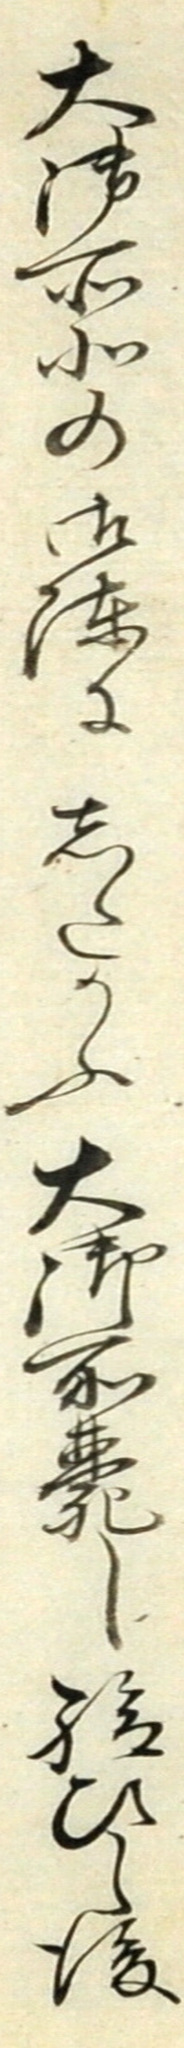大御所北の御陣にしたかふ大御所薨し給ひし後
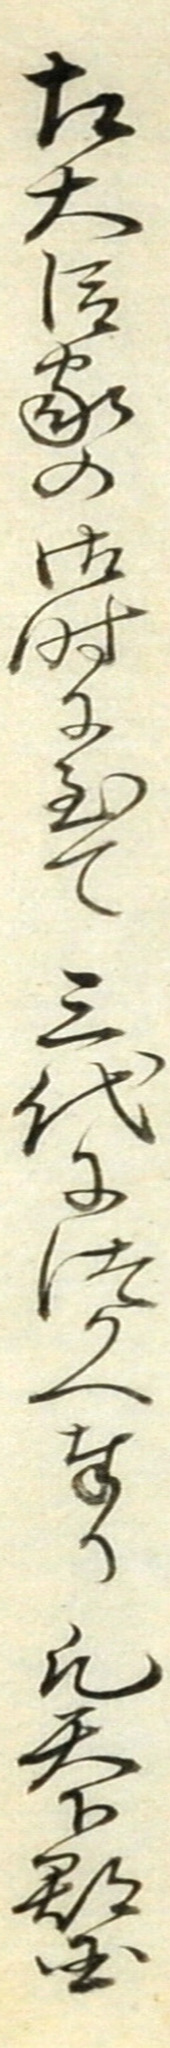左大臣家の御時に至て三代につかへ奉り凡天下郡国
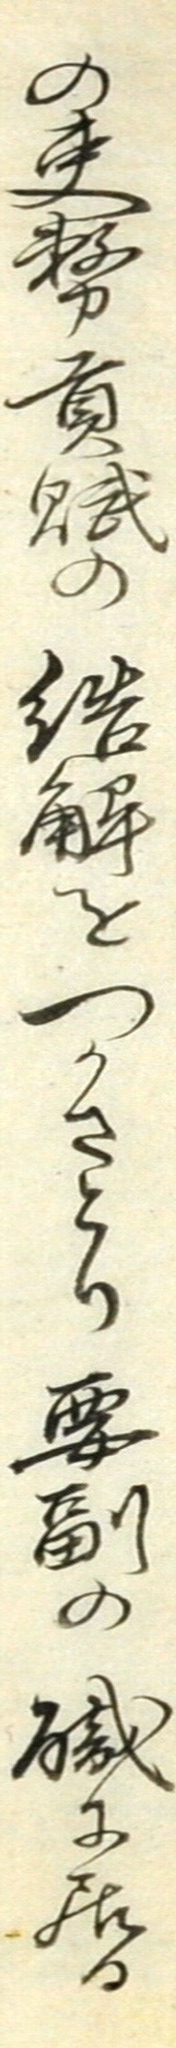の吏勢貢賦の結解をつかさとり要副の職に居る
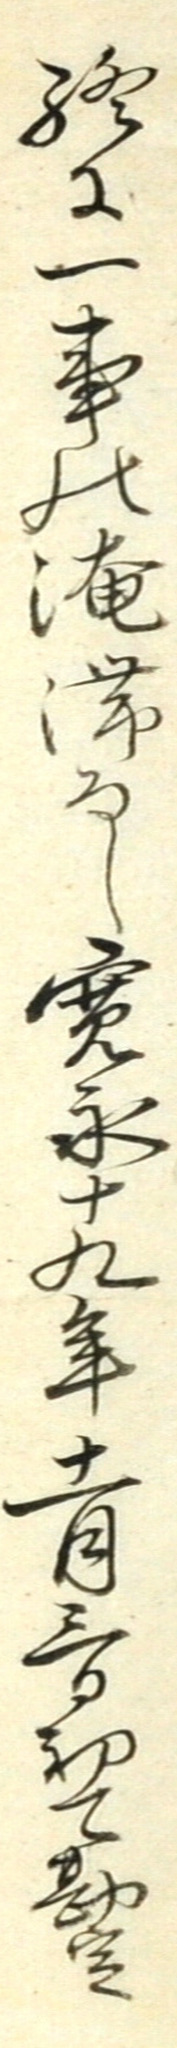終に一事の淹滞なし寛永十九年十一月三日初て勘定
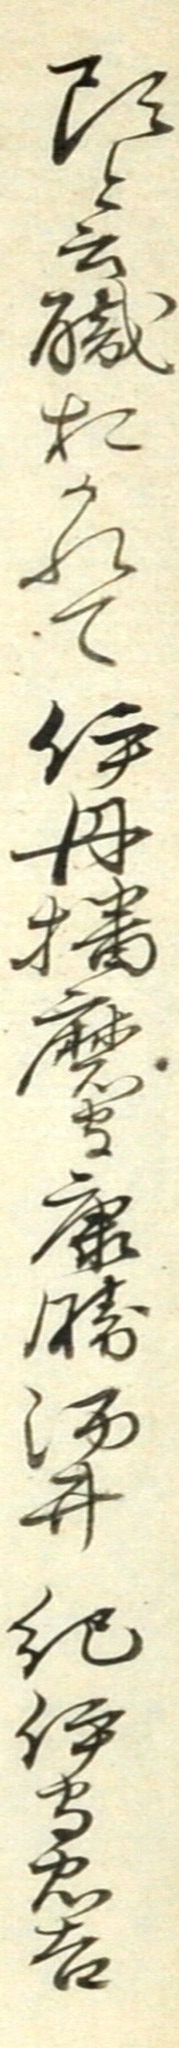頭と云職おかれて伊丹播磨守康勝酒井紀伊守忠吉
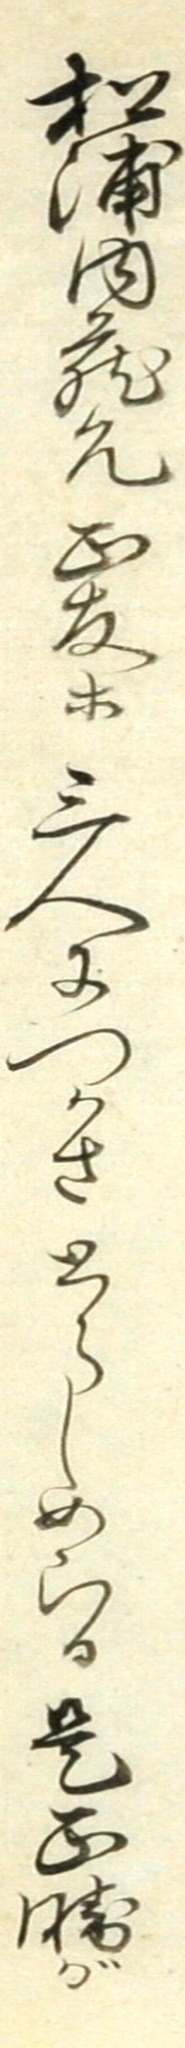松浦内蔵允正友等三人につかさとらしめらる是正勝が
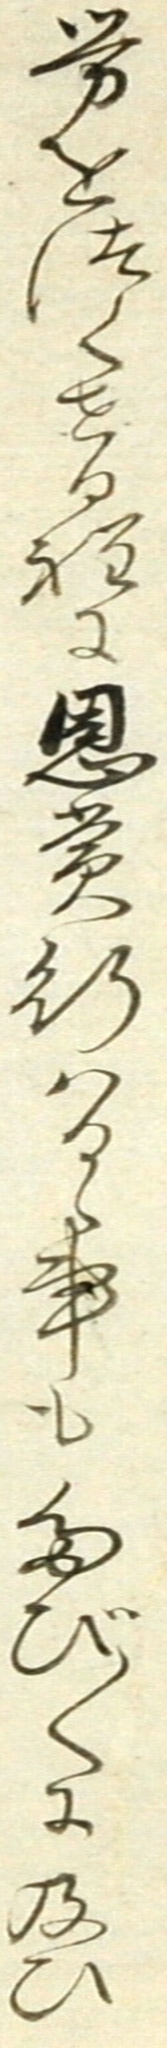労をつくせる程に恩賞行はるゝ事もたび〳〵に及ひ
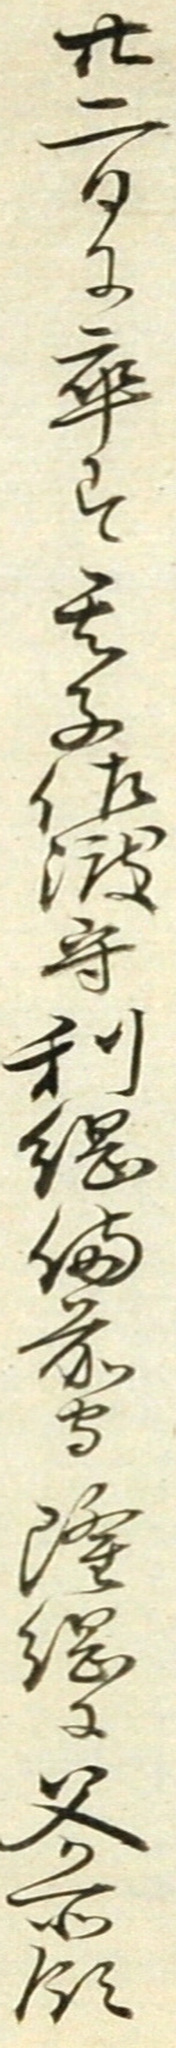廿二日に卒す其子佐渡守利綱備前守隆綱に父か所領
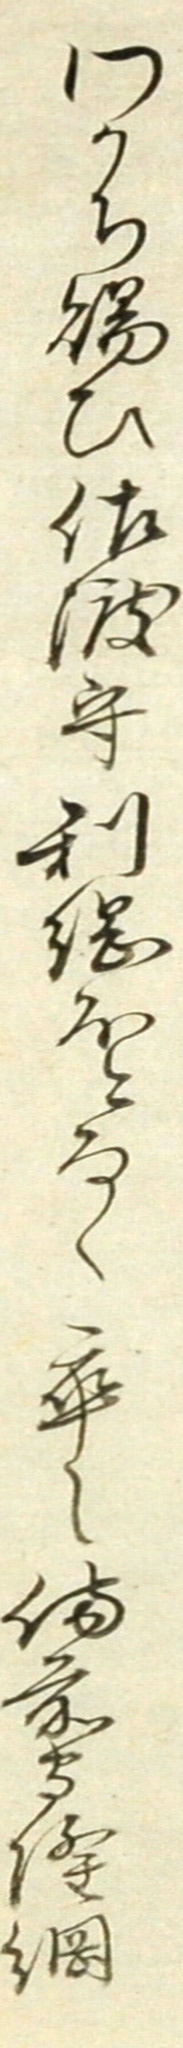わかち賜ひ佐渡守利綱ほとなく卒し備前守隆綱
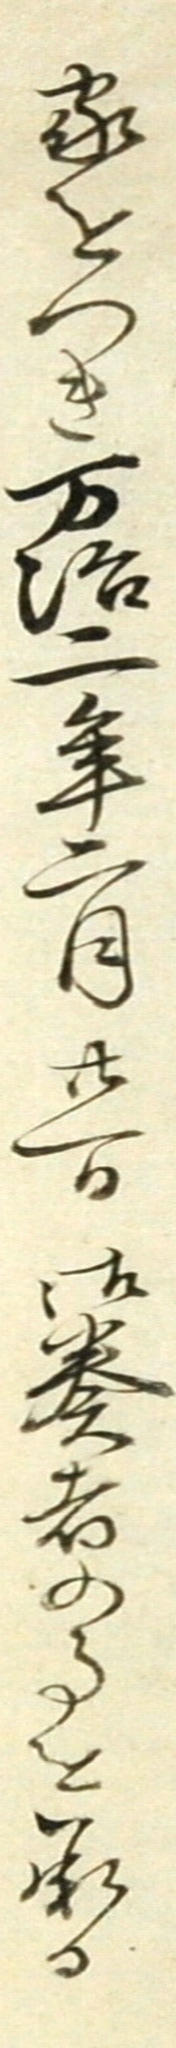家をつき万治二年二月廿一日御奏者の事を承る
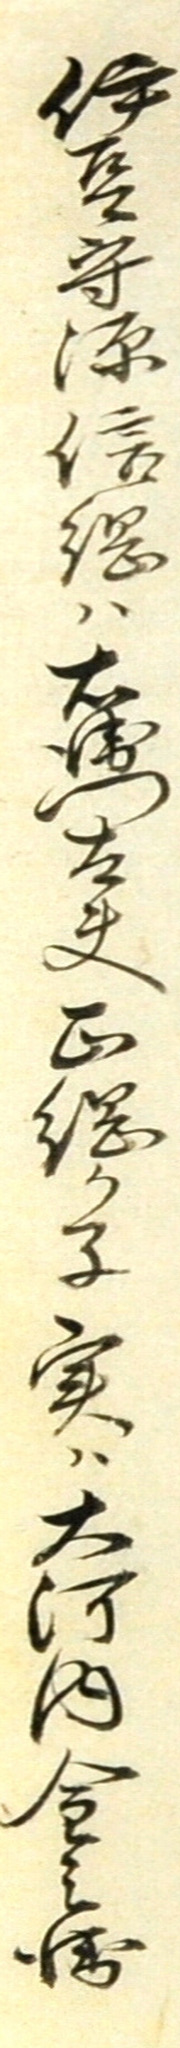伊豆守源信綱は右衛門太夫正綱か子実は大河内金兵衛

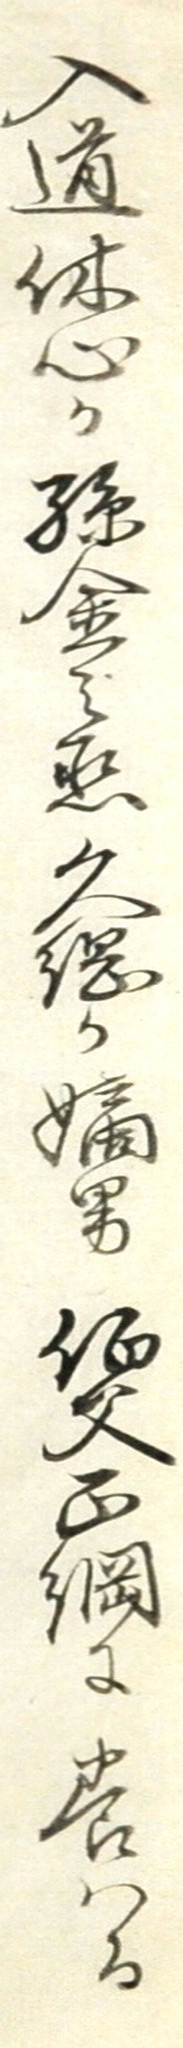入道休心か孫金之烝久綱か嫡男伯父正綱に養はる
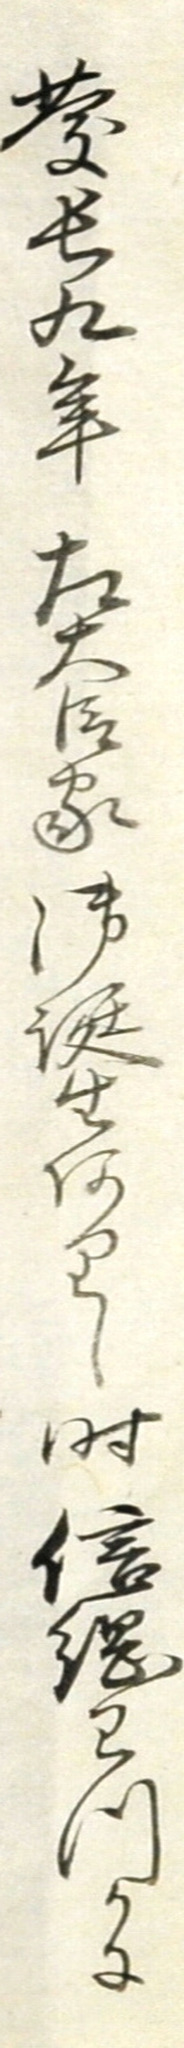慶長九年左大臣家御誕生ありし時信綱わつかに
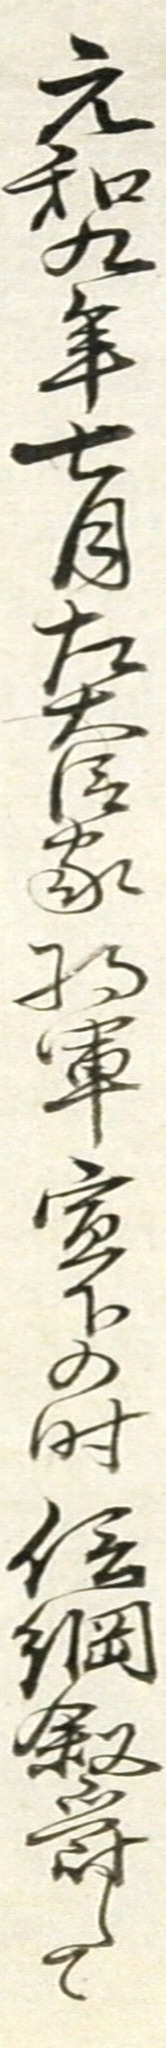元和九年七月左大臣家将軍宣下の時信綱叙爵して
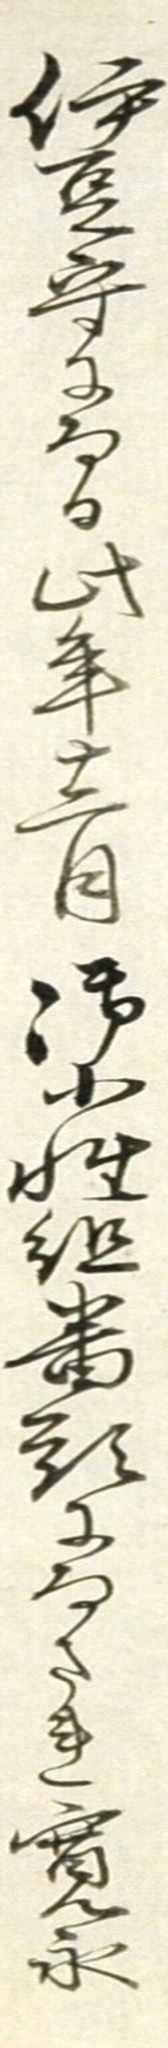伊豆守になる此年十二月御小性組番頭になされ寛永
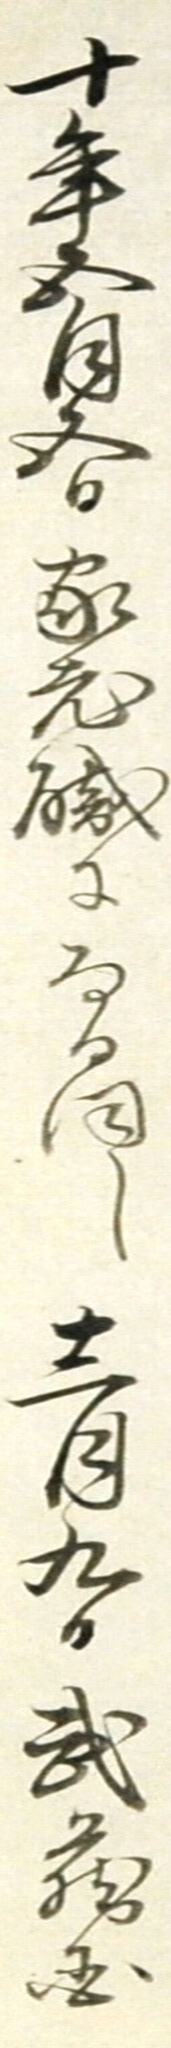十年五月五日家老職になる同し十二月九日武蔵国
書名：藩翰譜（二・三）
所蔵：伊那市立高遠町図書館・合同会社AMANE
